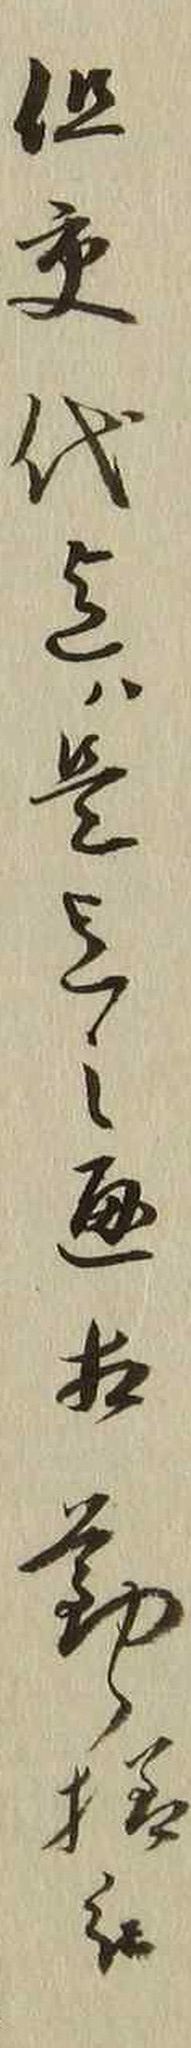但交代迄ハ是迄之通相勤候様被
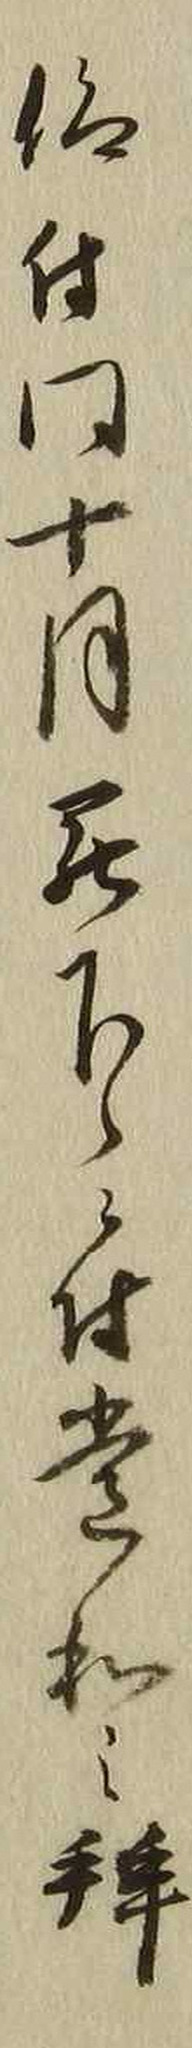仰付同十月罷下候ニ付常和之拝
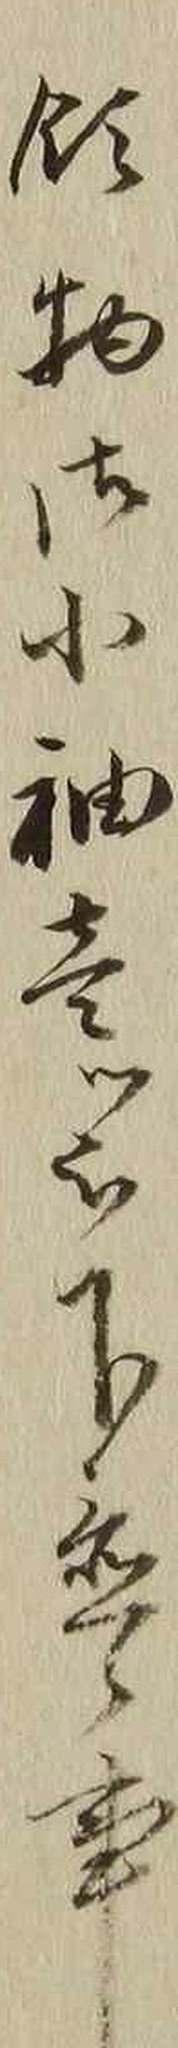領物御小袖壱ツ被下置候事
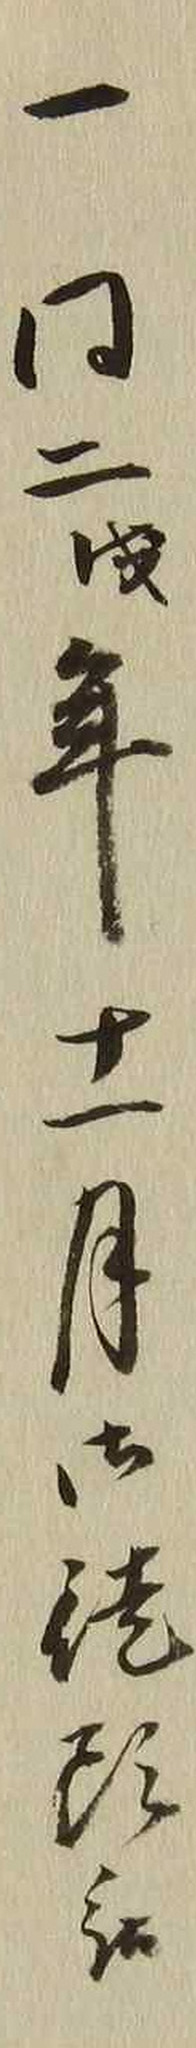一同二戌年十一月御徒頭被
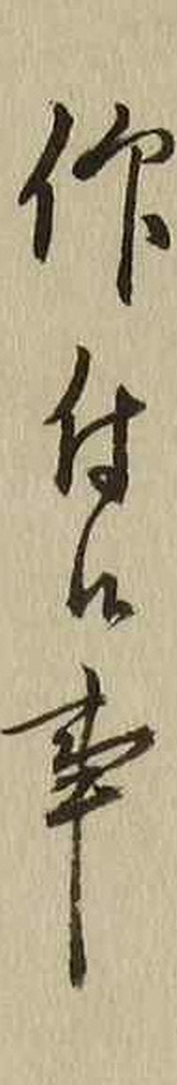仰付候事
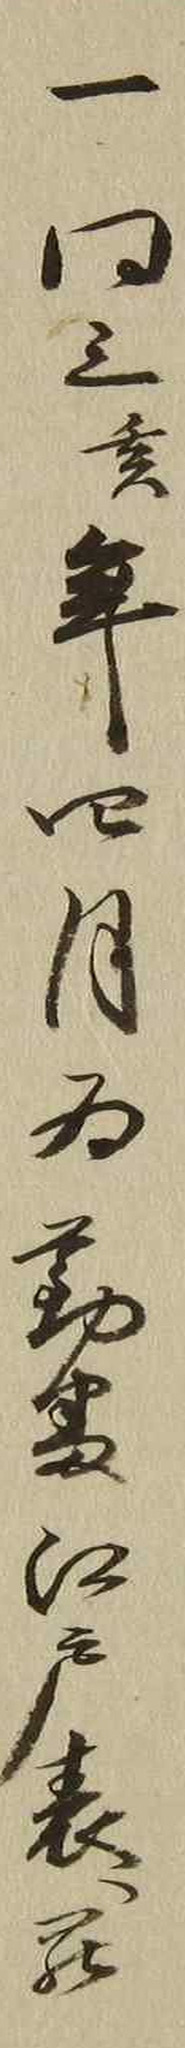一同三亥年四月為勤番江戸表へ罷
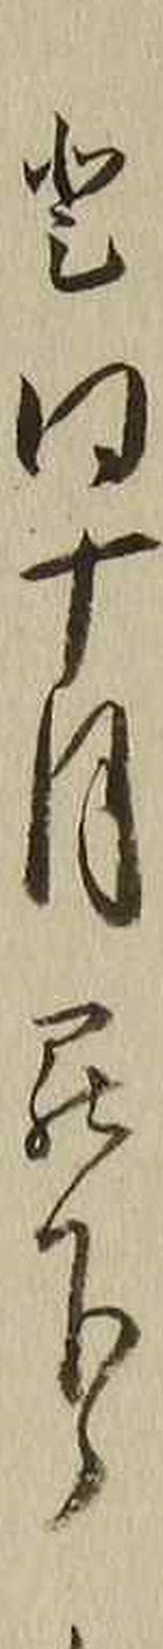登同十月罷下候
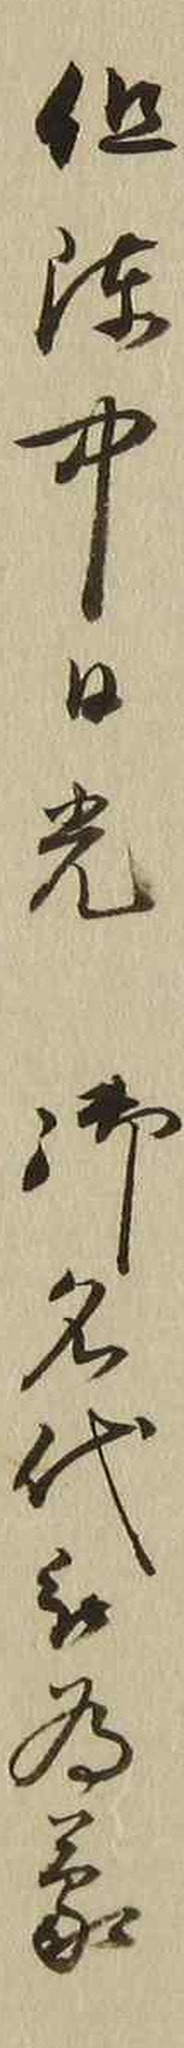但陣中日光御名代被為蒙
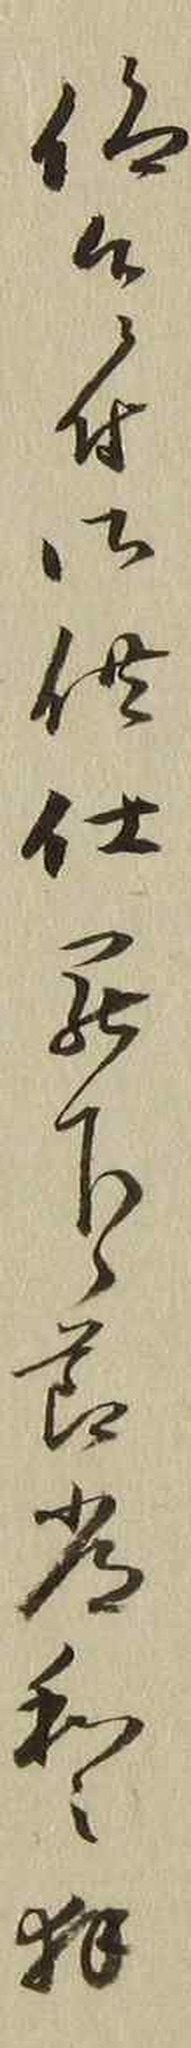仰候ニ付御供仕罷下候節常和之拝
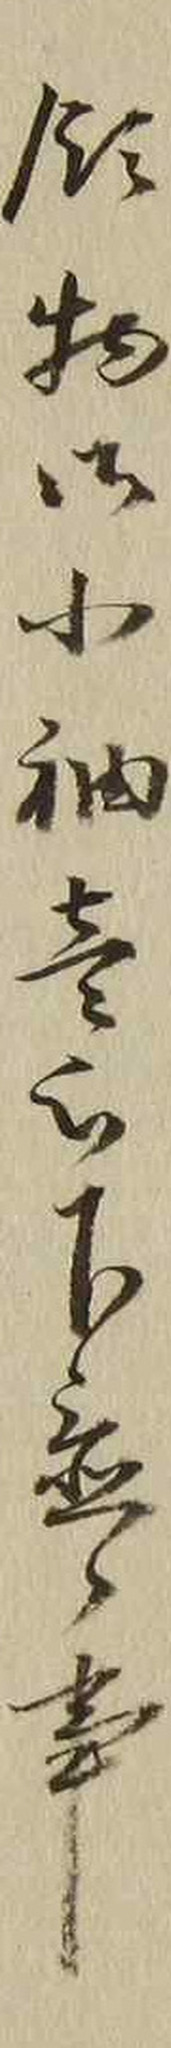領物御小袖壱被下置候事
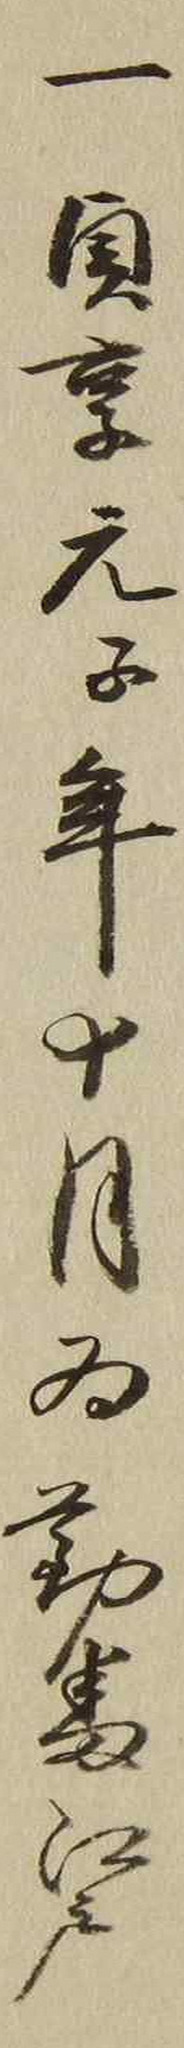一貞享元子年十月為勤番江戸
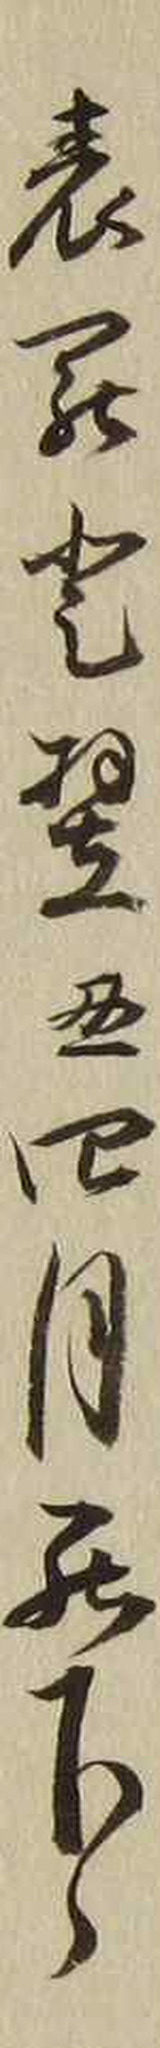表罷登翌丑四月罷下候
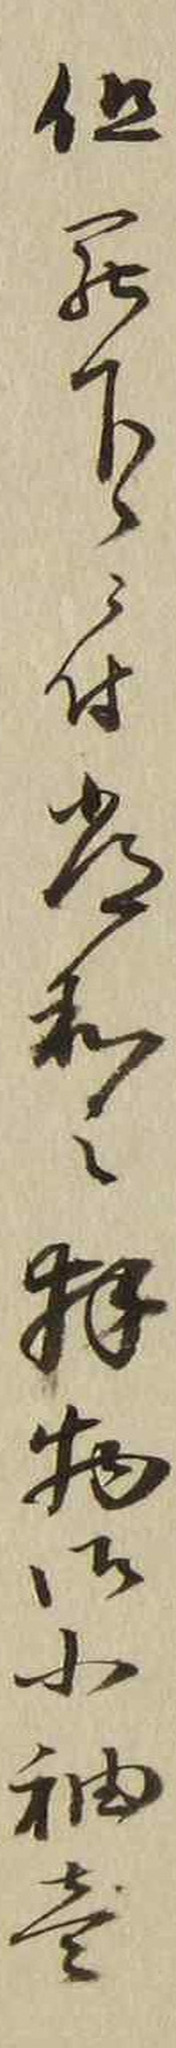但罷下候ニ付常和之拝物御小袖壱
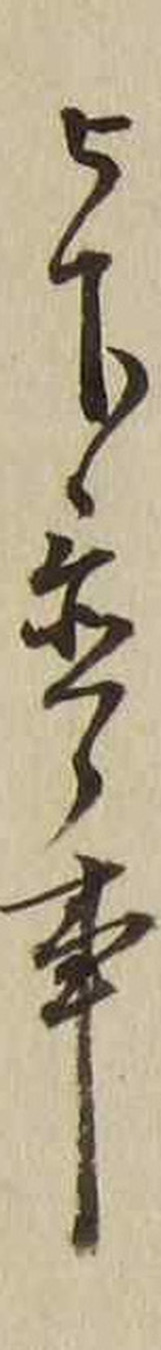被下置候事

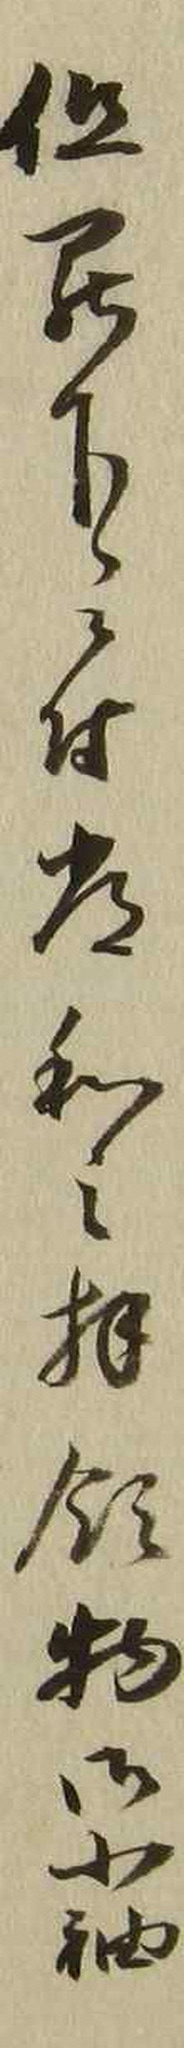但罷下候ニ付常和之拝領物御小袖
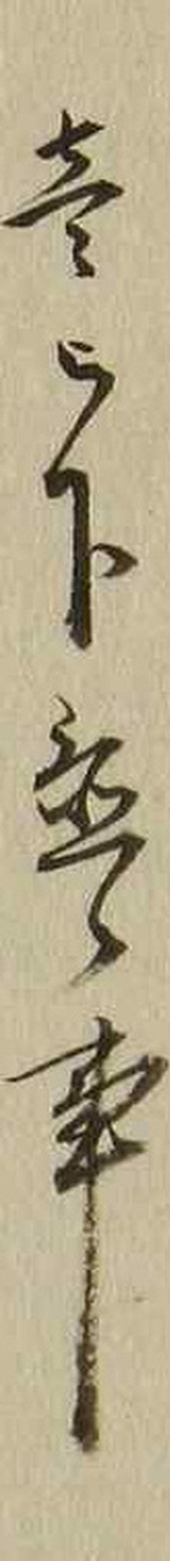壱被下置候事
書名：諸士系譜　巻之69　を之部3
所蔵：会津若松市立会津図書館
